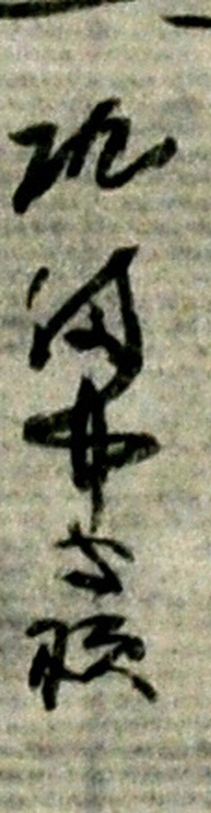堀備中守様
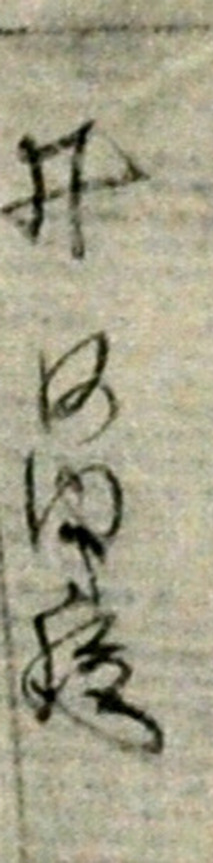井河内殿
